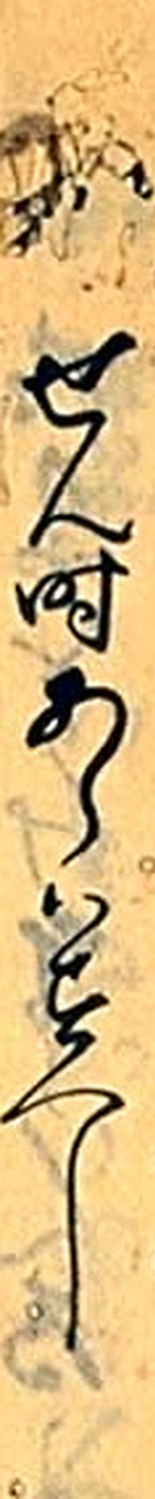せん時あらはすへし
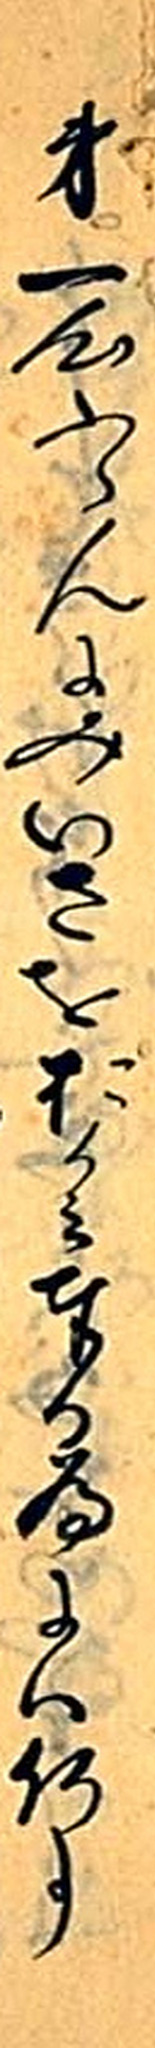弟一心ふらんにみいさをおかみ奉る為には何事
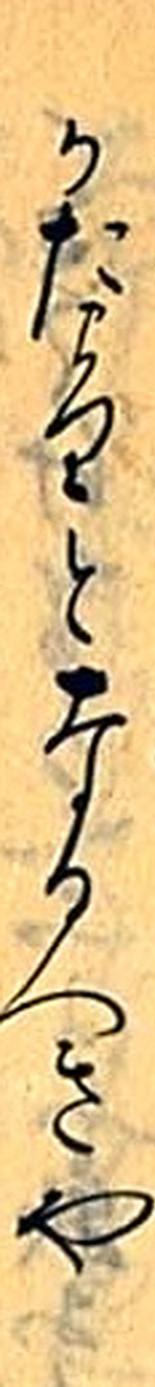かたよりとなるへきや
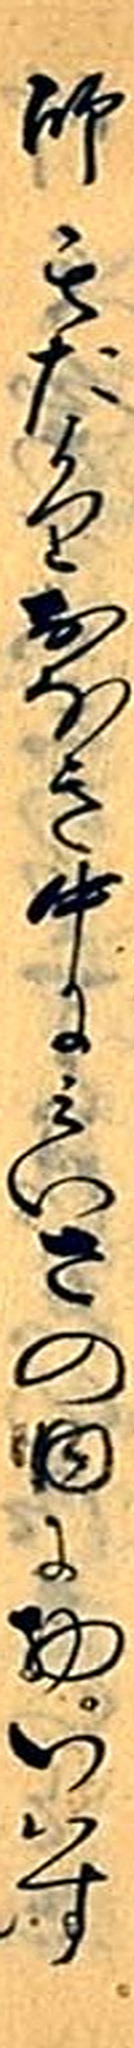師其たよりおほき中にみいさの内に物いはす
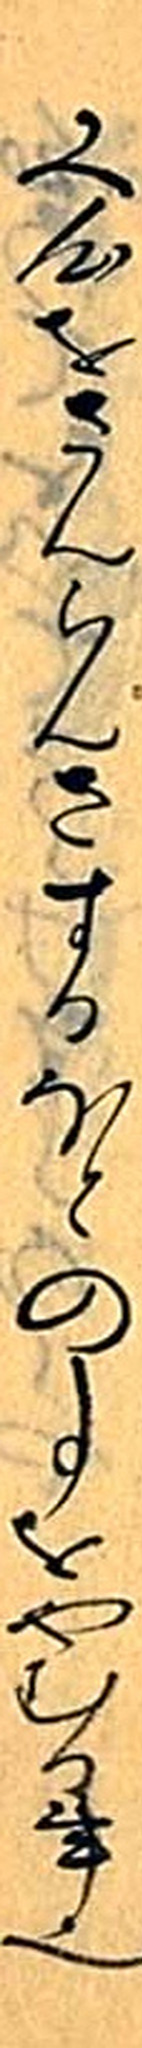又心をさんらんさするほとの事をやむる事也
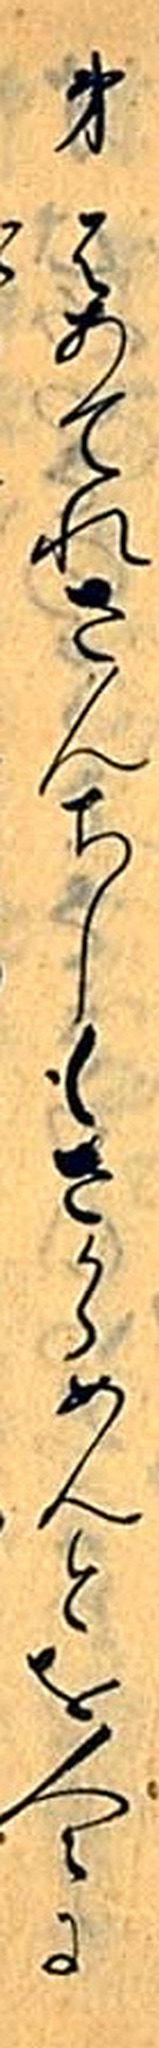弟はあてれさんちしもさからめんとを人々に
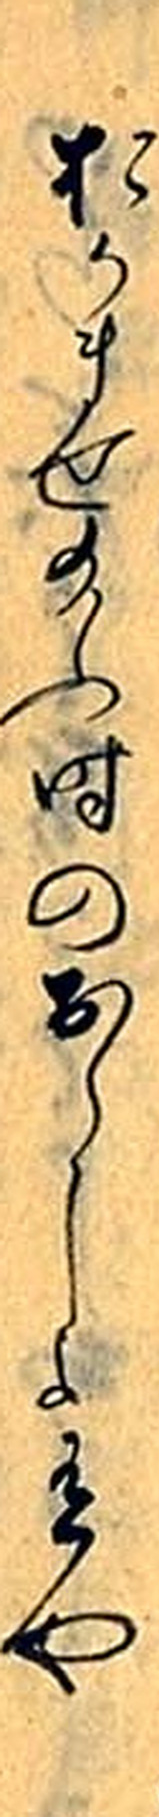おかませ給ふ時のおらしよ有や
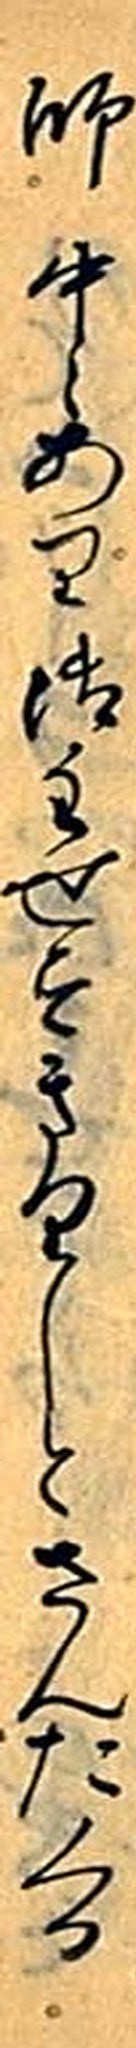師中々あり御主せすきりしとさんたくる
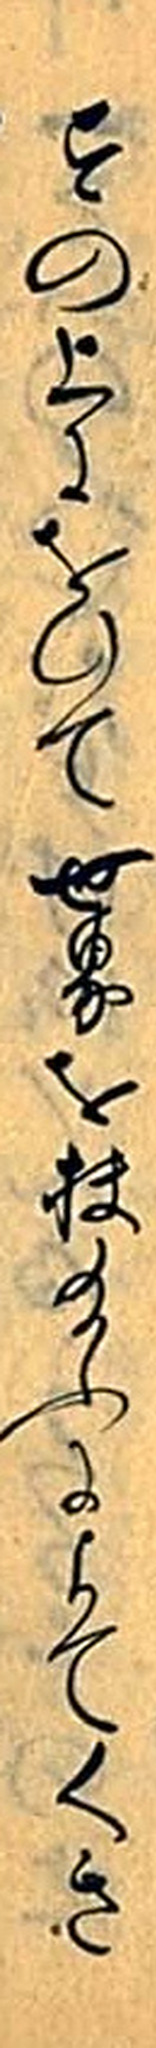すの上にをひて世界を扶給ふによてくき
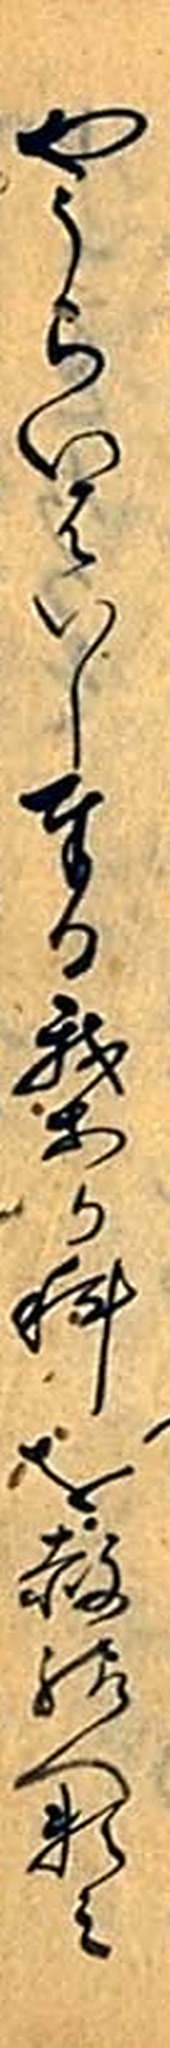やうらいはいし奉る我等か科を赦給へ頼み
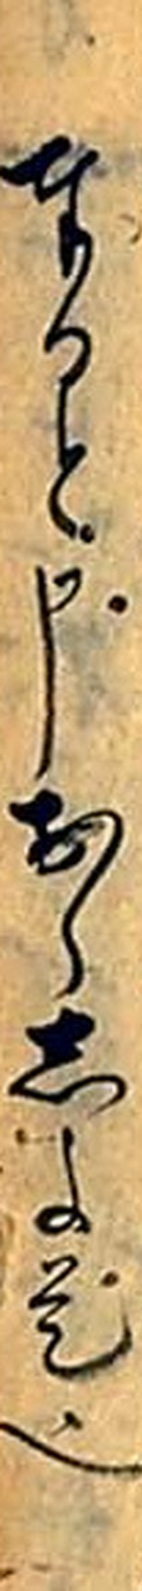奉ると申おらしよ是也

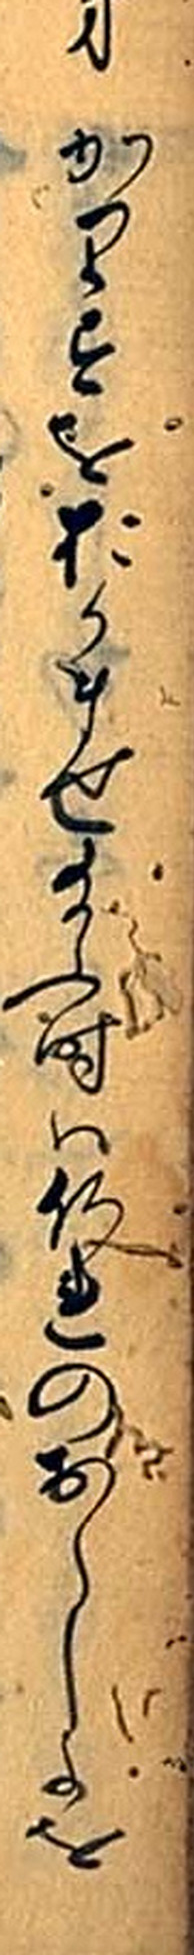弟かりすをおかませ給ふ時は何れのおらしよを
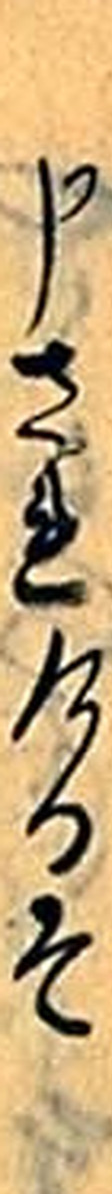申されけるそ
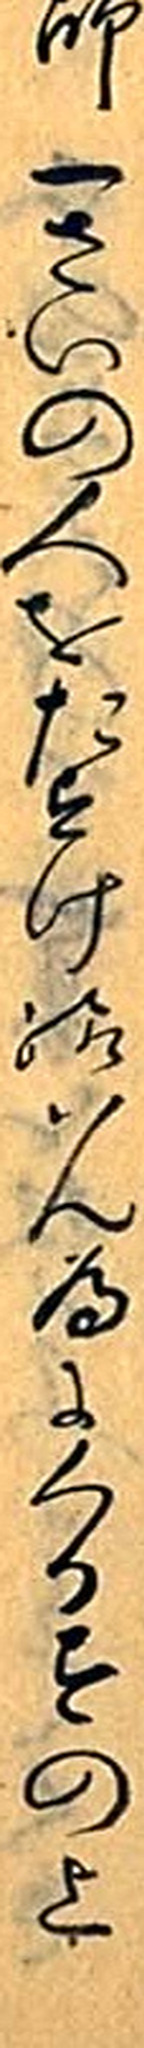師一さいの人をたすけ給はん為にくるすの上
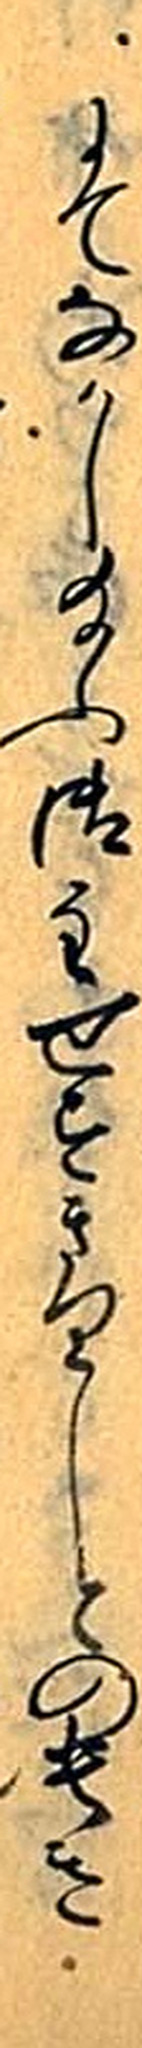にてなかし給ふ御主せすきりしとの貴き
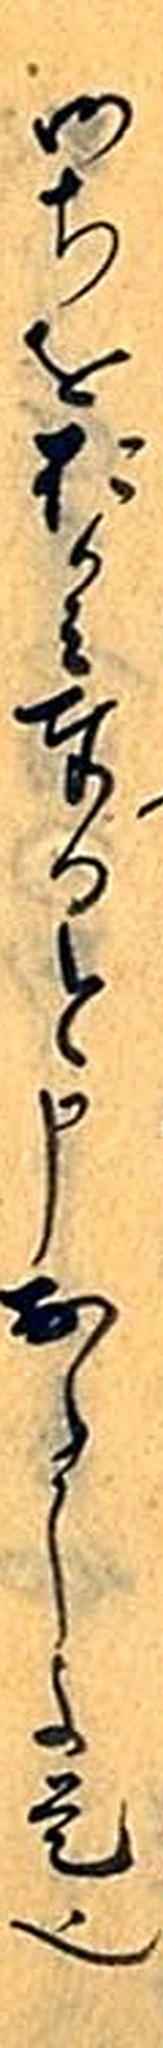御ちをおかみ奉ると申おらしよ是也
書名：ドチリナ・キリシタン
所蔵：東京大学総合図書館 / General Library in the University of Tokyo
